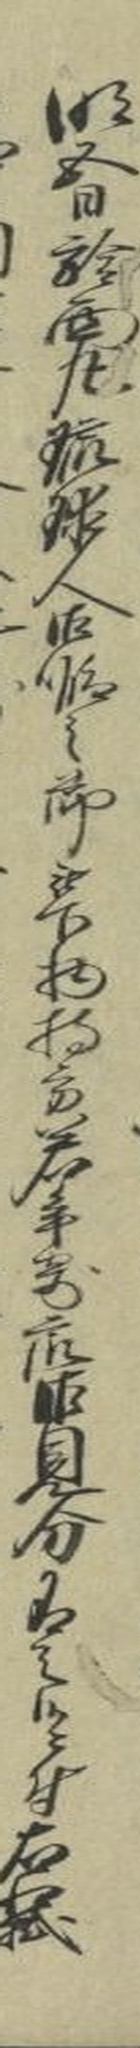一明五日於西丸琉球人御暇之節御被下物持方若年寄衆御見分有之候に付右相掛
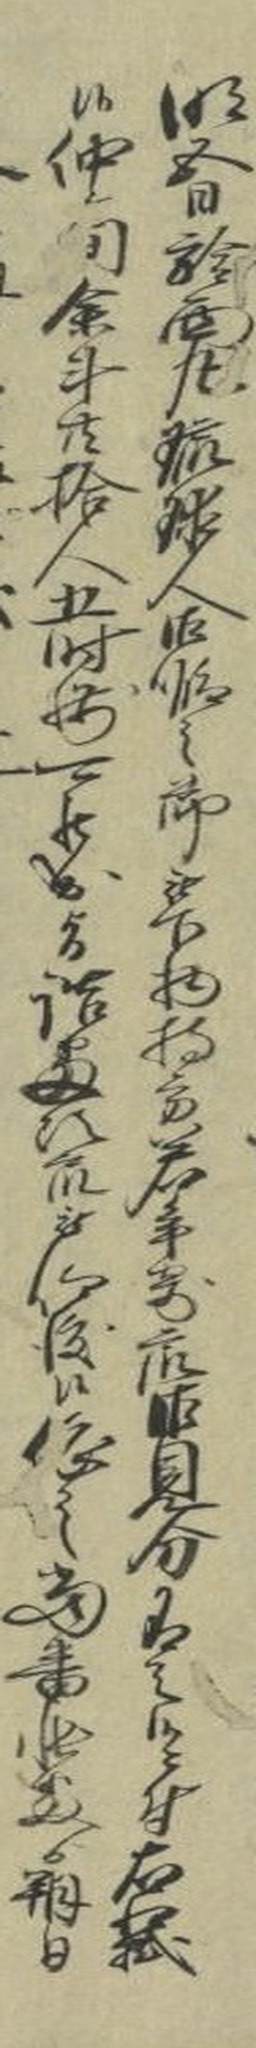候仲か間余計共拾人五時揃可罷出旨詰番頭衆被仰渡候依之当番帳番ゟ朔日
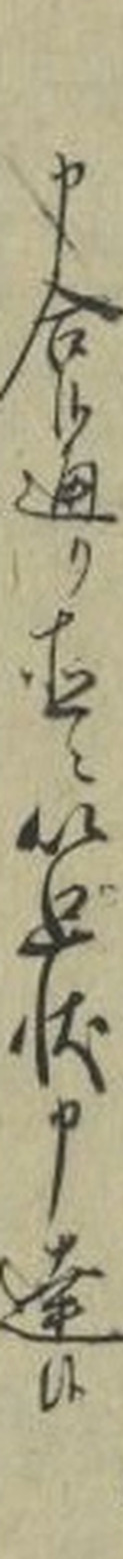申合候通り直に以廻状申達候
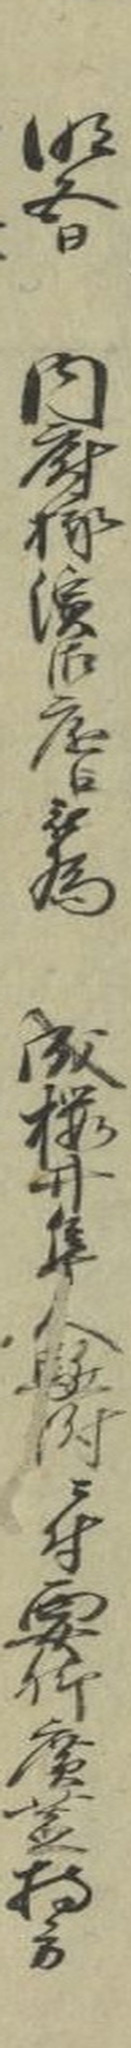一明五日内府様浜御庭え被為成桜井隼人駈附に付要御広蓋持方
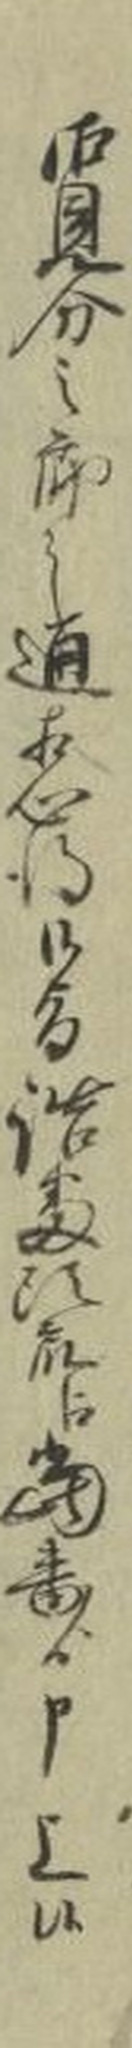御見分之節之通相心得候旨詰番頭衆え当番ゟ申上候
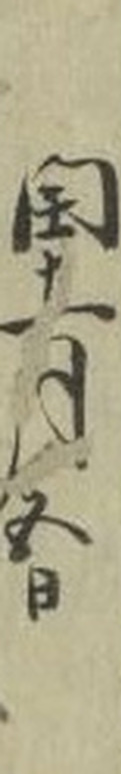閏十一月五日
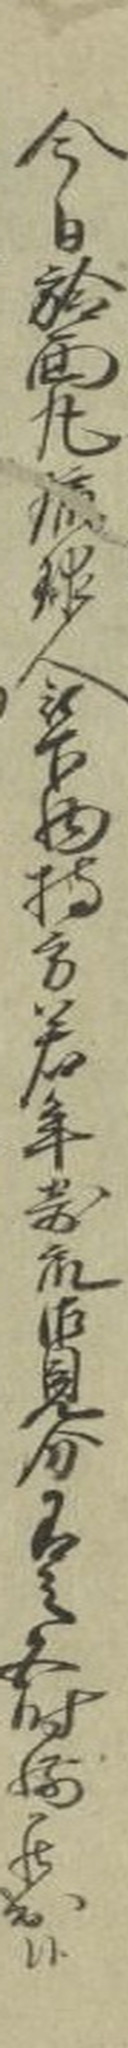一今日於西丸琉球人被下物持方若年寄衆御見分有之五時揃罷出候
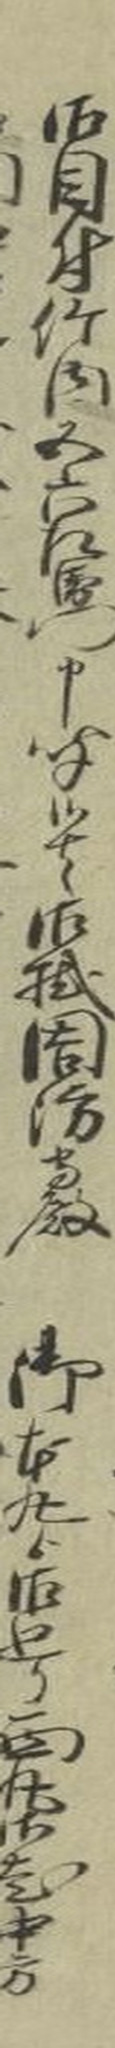一御目付竹内五六左衛門申聞候は御掛周防守殿御本丸え御廻り西丸御老中方
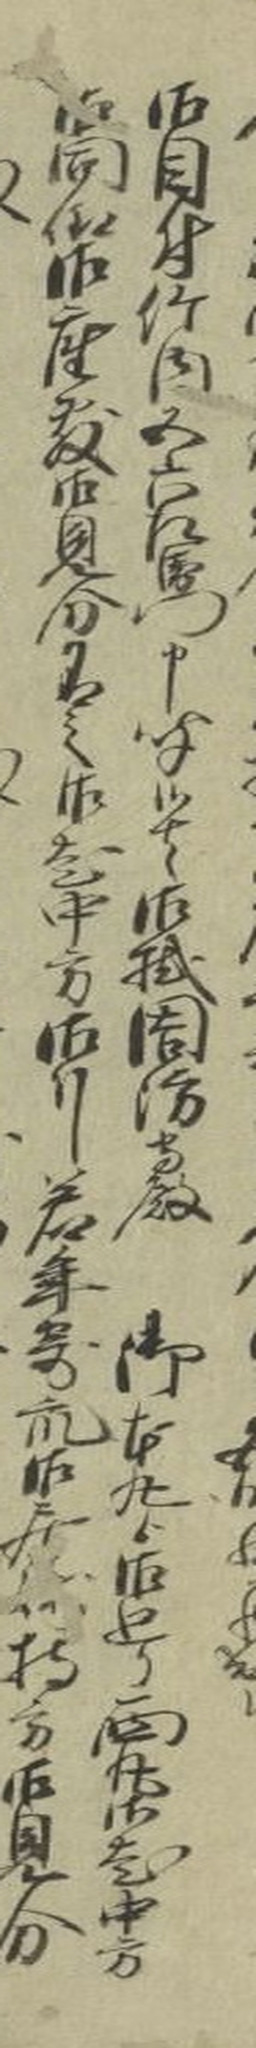御同様御座敷御見分有之御老中方御引若年寄衆御居持方御見分
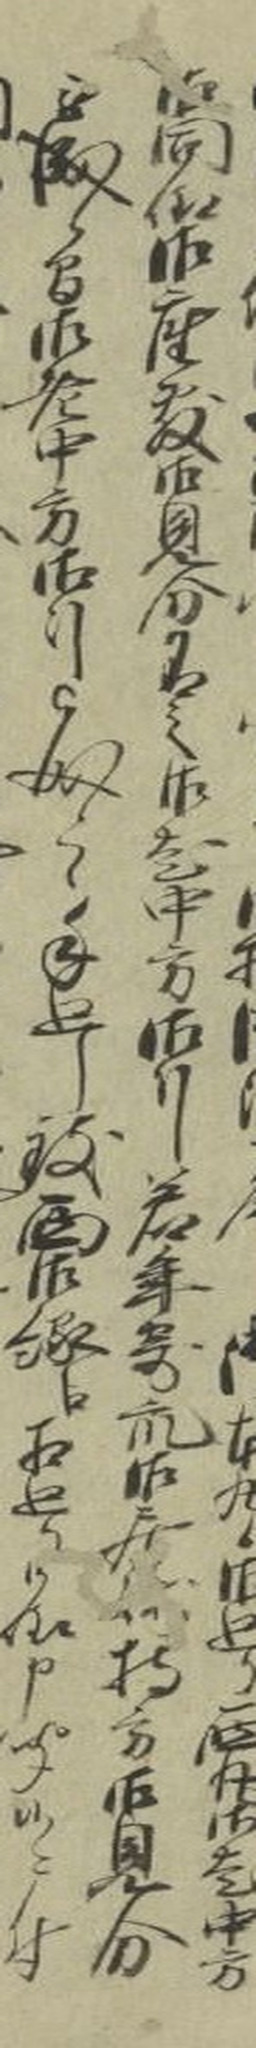被成候間御老中方御引被成候はゝ手廻し致西御縁え相廻り候様申聞候に付
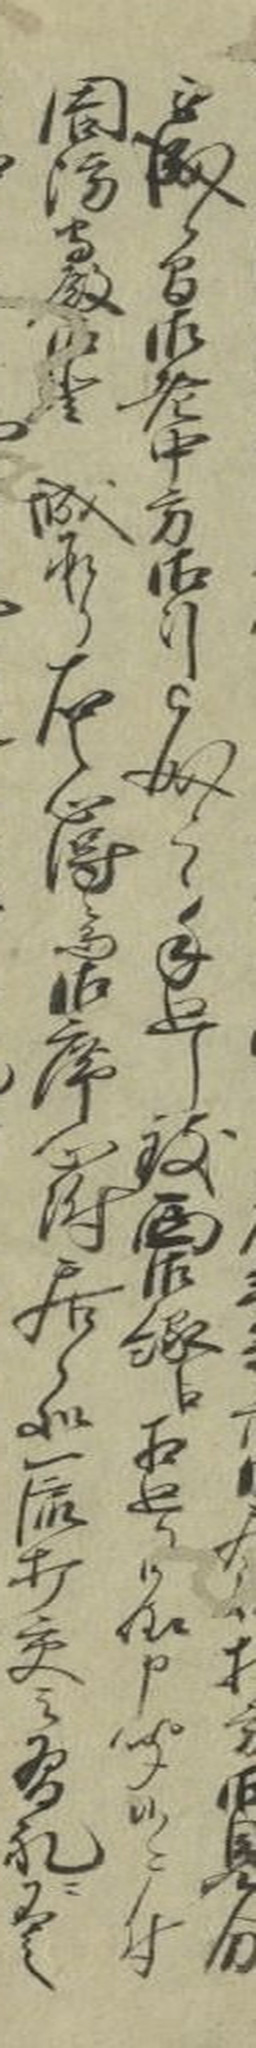周防守殿御登城承り右之心得にて御関心附居候処一流打交之習礼に有之
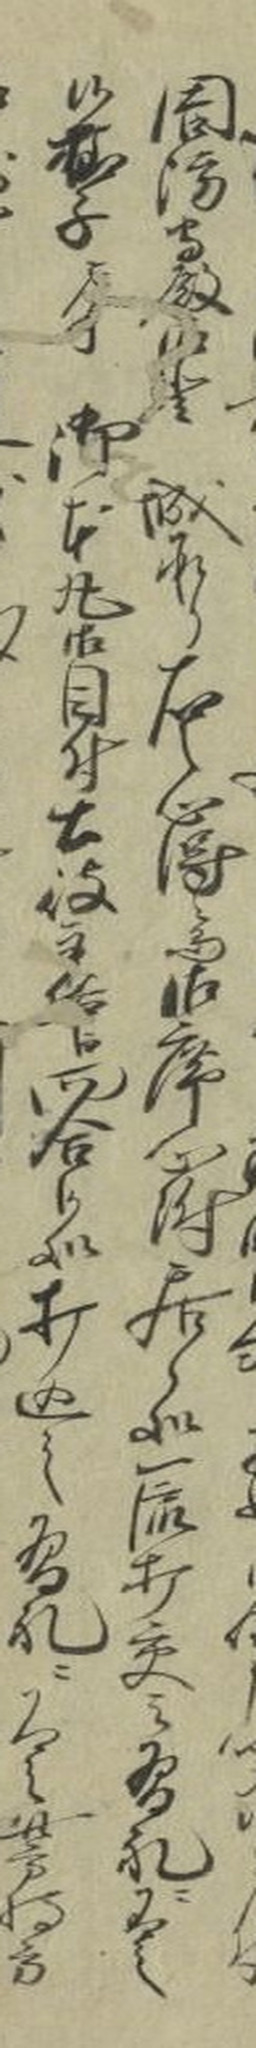候様子に付御本丸御目付土岐主膳え問合候処打込之習礼に有之此方持方
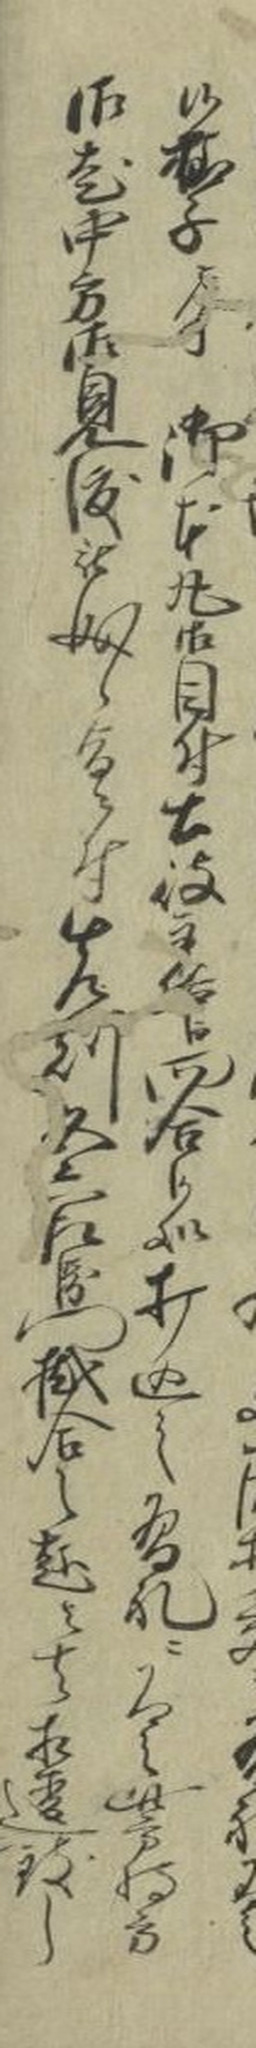御老中方御見渡被成候旨に付先刻五六左衛門掛合之趣とは相違致し

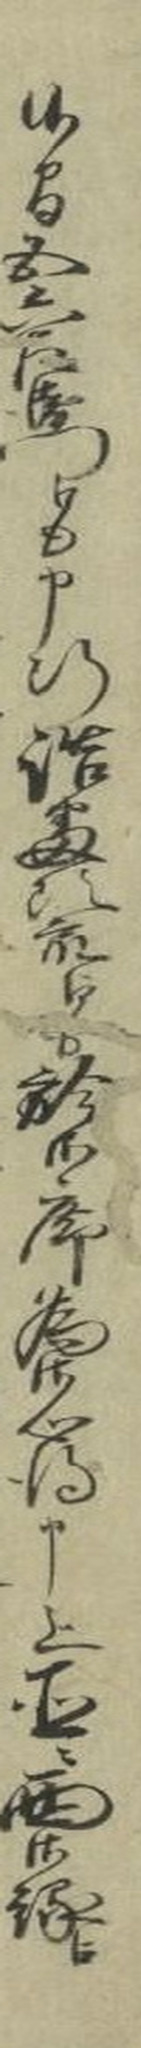候間五六左衛門えも申断詰番頭衆えも於御席為御心得申上直に西御縁え
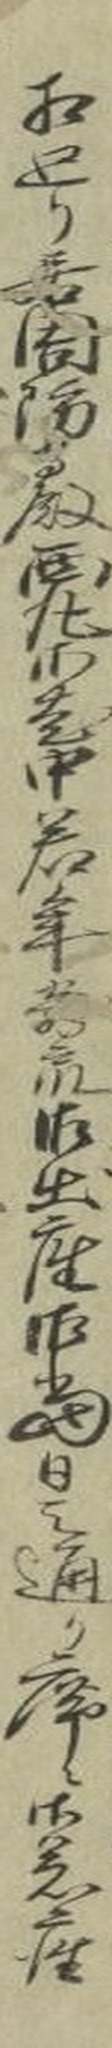相廻り居周防守殿西丸御老中若年寄衆御出座御当日之通り席に御着座
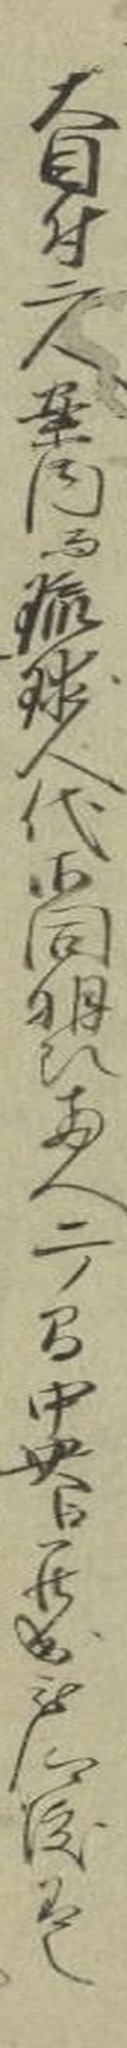大目付二人案内而琉球人代御同朋頭両人二の間中央え罷出被仰渡有之
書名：天保三壬辰年琉球人参府之節勤方書留
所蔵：University of the Ryukyus Library
